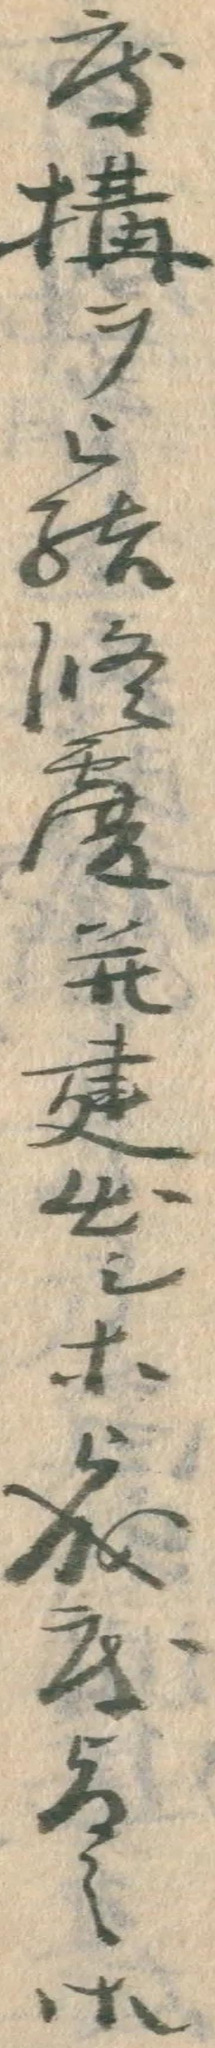度構ヲ被詰、修覆幷建出シ等被成度旨之御
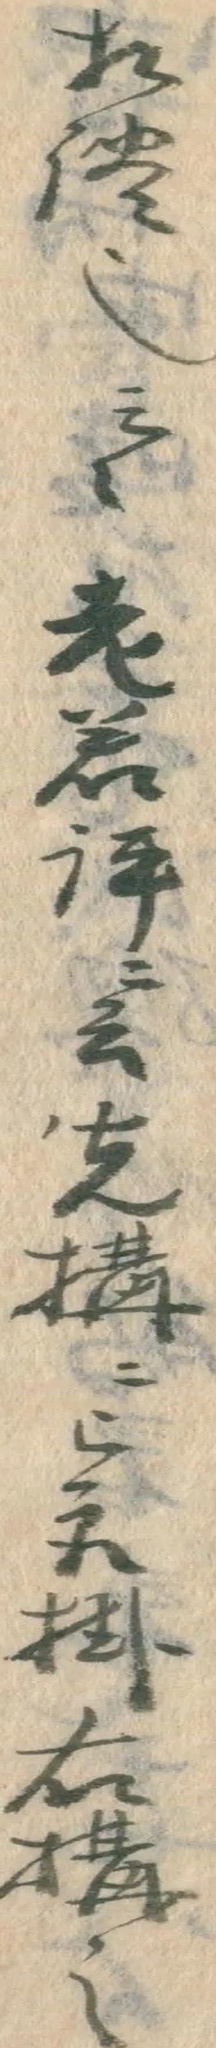相談也云々、老若評ニ云、先構ニ被取掛右構之
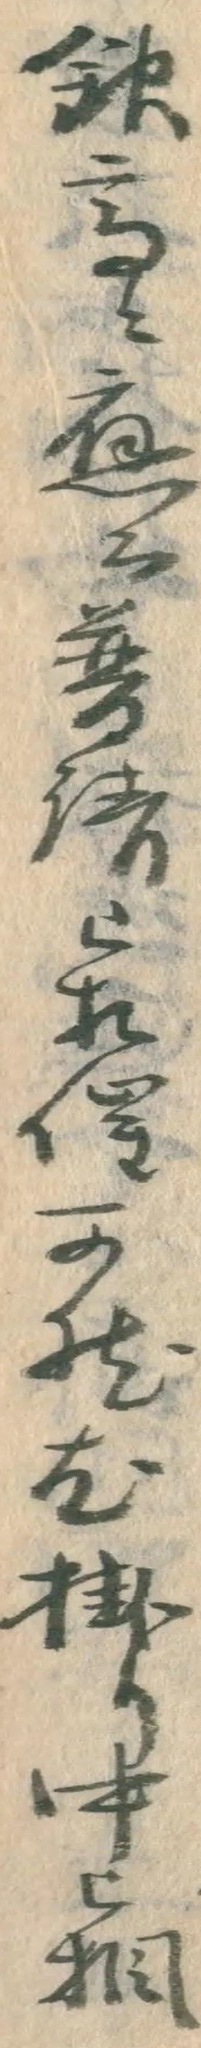銀高ニ應而普請被相催可然、尤掛り中被相

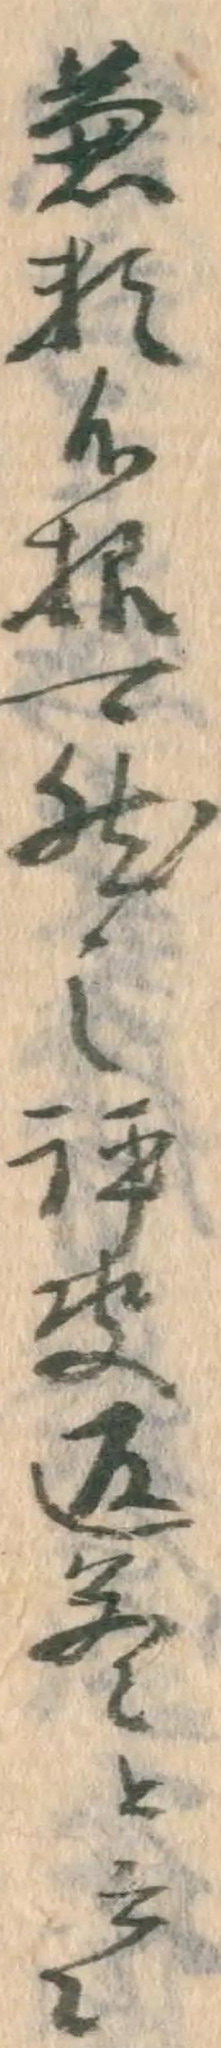兼頼候様、可然之評決返答と云々、
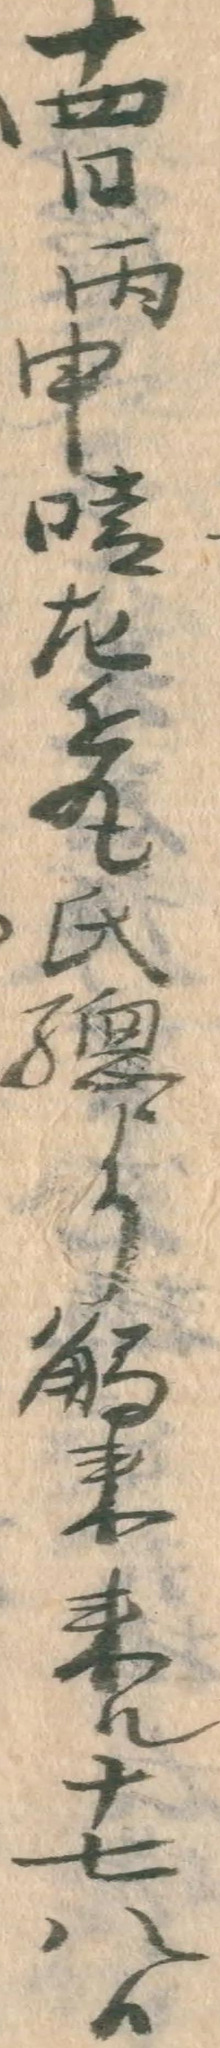十四日丙申晴、左近丸氏總より触、来ル十七・八日
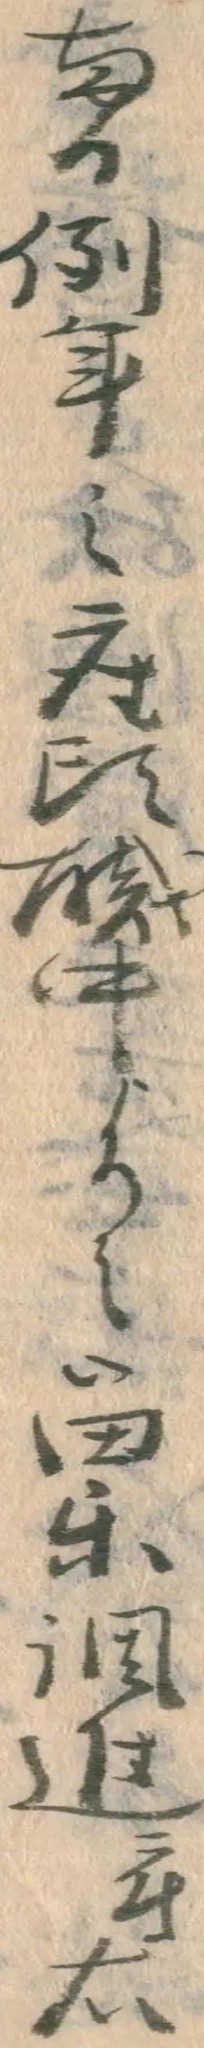両日、例年之座頭、職中より之御田楽調進ニ付、右
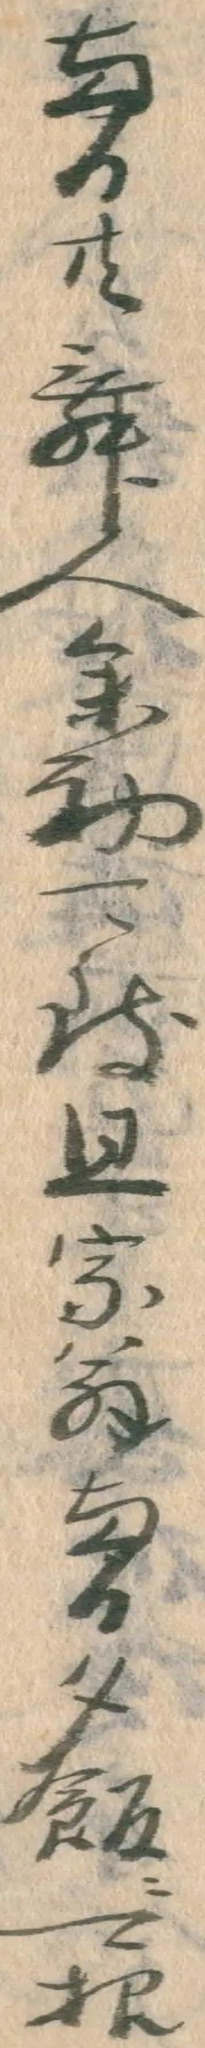両日共舞人参勤可致、且家翁両日夕飯ニ可様
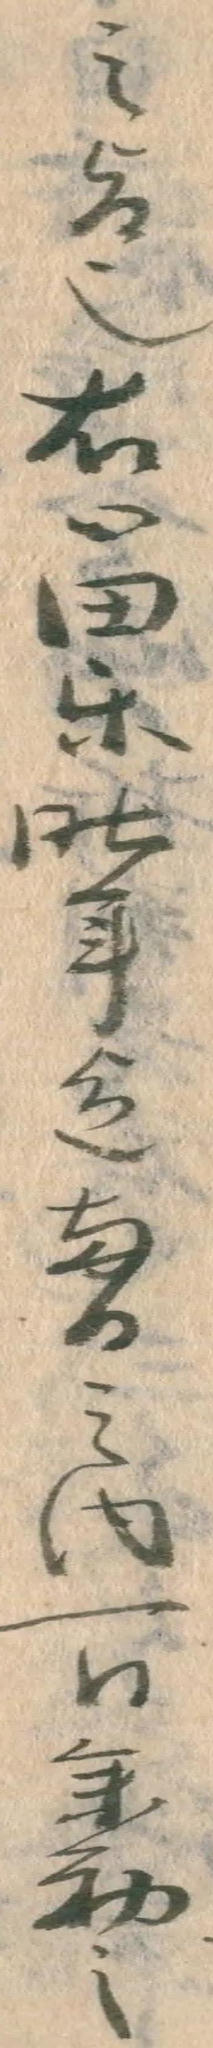之旨也、右御田楽、昨年迄両日之内一日参勤之
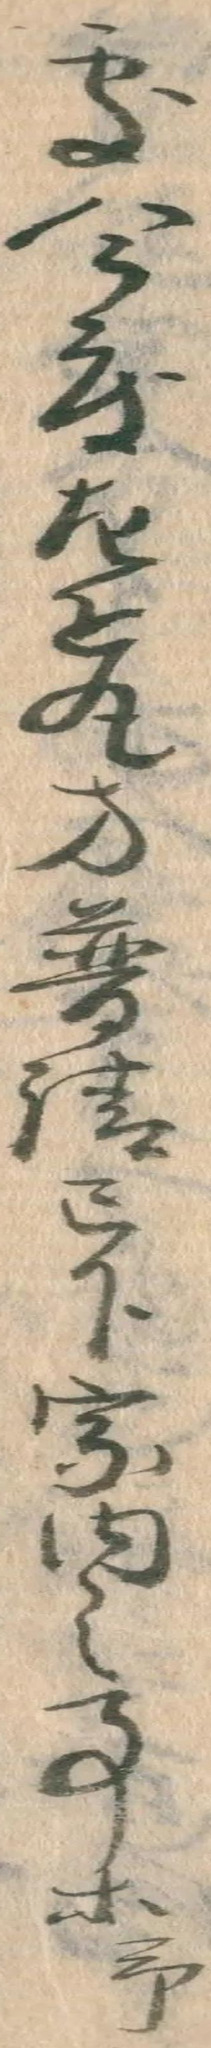處、今度左近丸方普請已下家内之事等、予
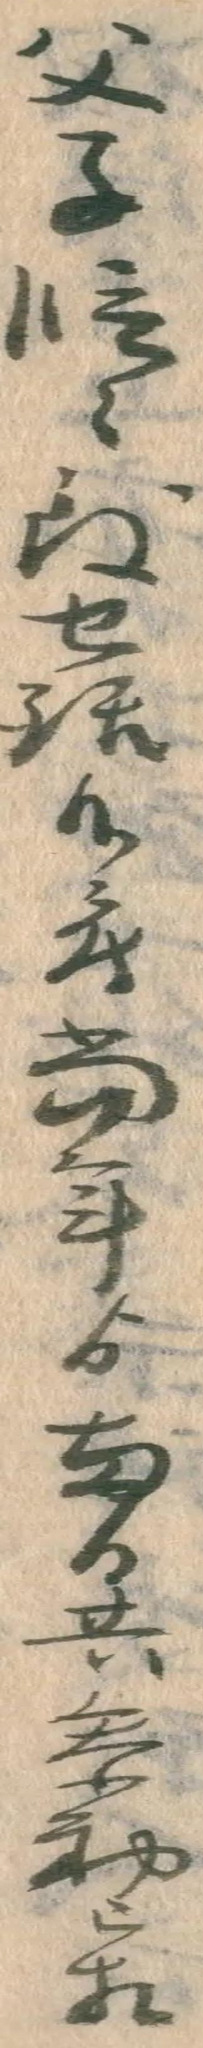父子段々致世話候ニ付、當年ゟ両日共参勤被相
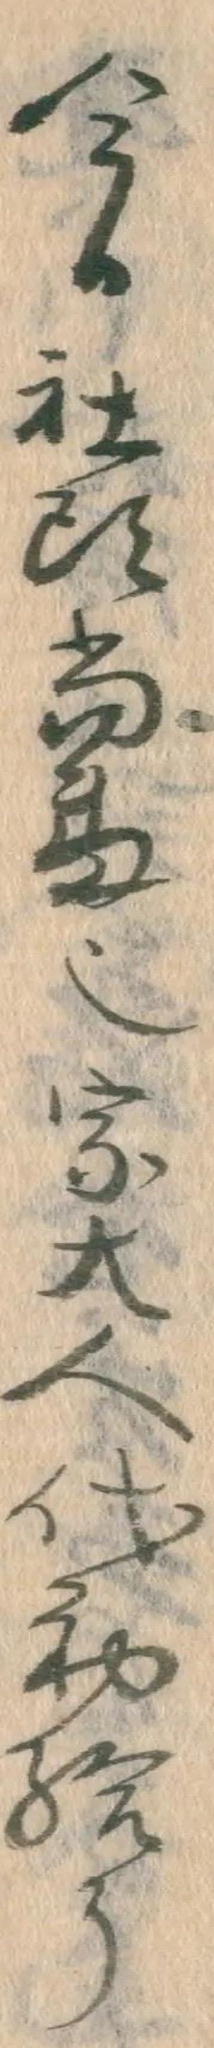今日社頭當番也、家大人代勤給了、
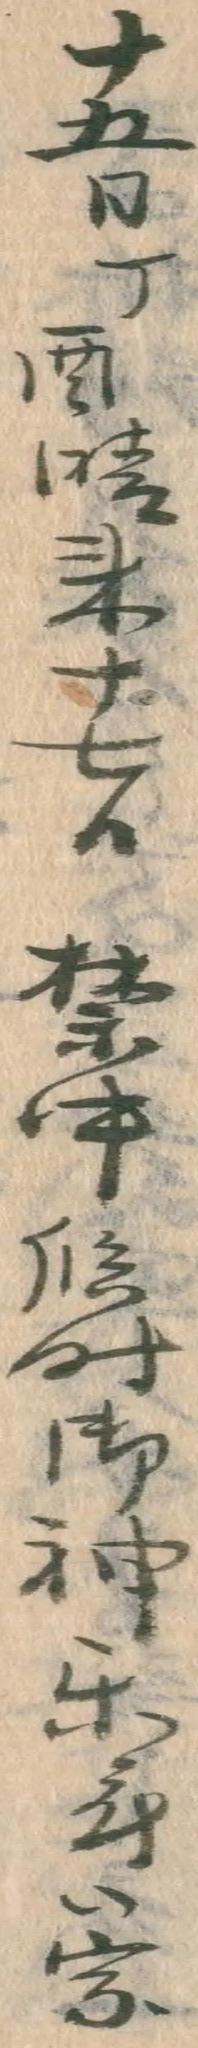十五日丁酉晴、来十七日禁中臨時御神楽ニ付、御家
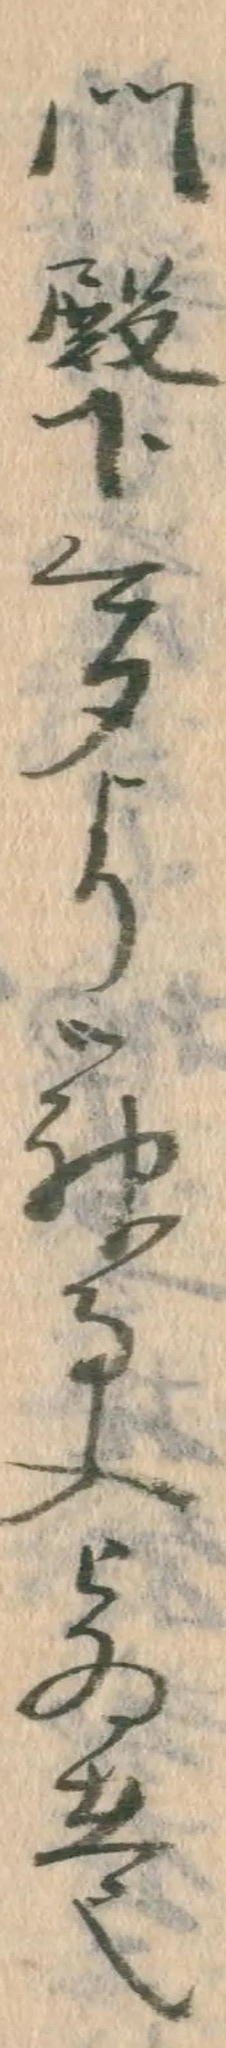門殿下、今夕より御神事入被為在之、
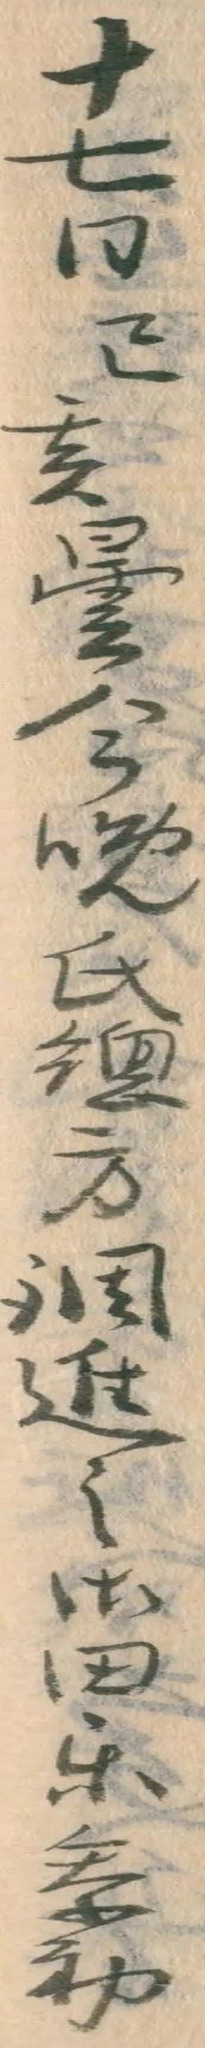十七日己亥曇、今晩氏總方調進之御田楽参勤
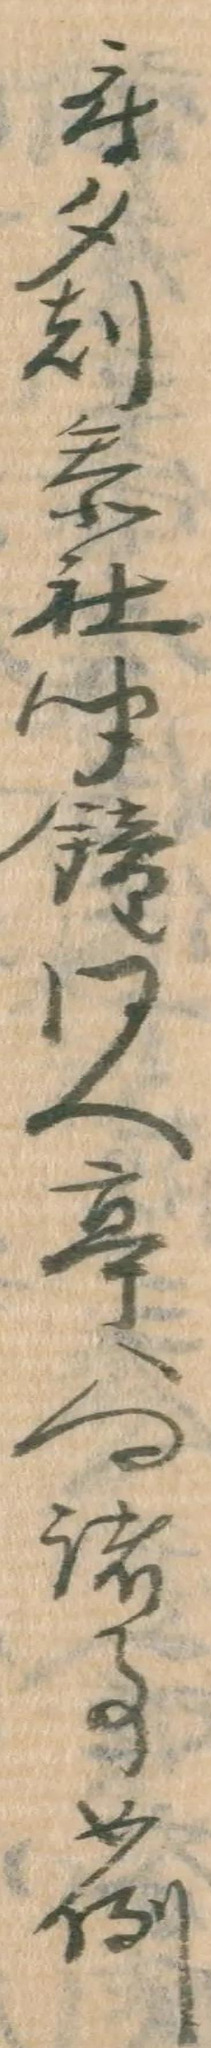ニ付夕刻参社、守鐘同人亭へ向、諸事如例、
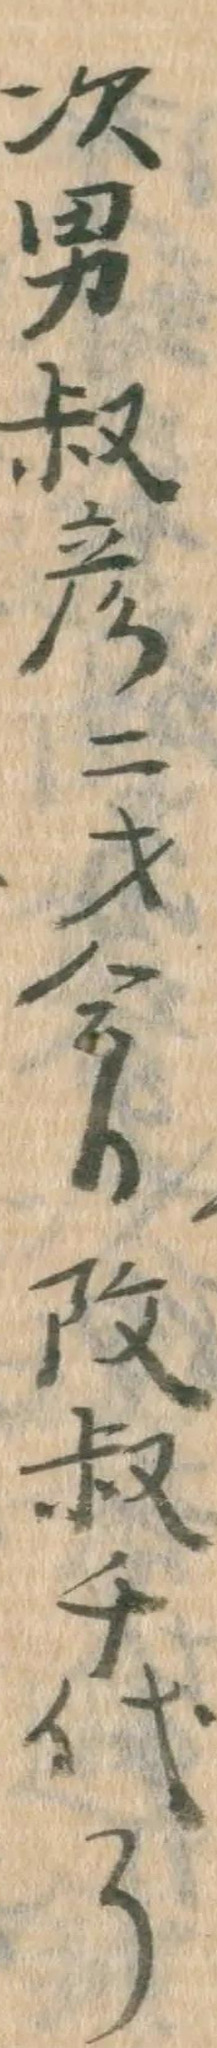次男叔彦二才、今日改叔千代了、
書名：賀茂社記録. 第63冊
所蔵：国立国会図書館 National Diet Library, JAPAN
